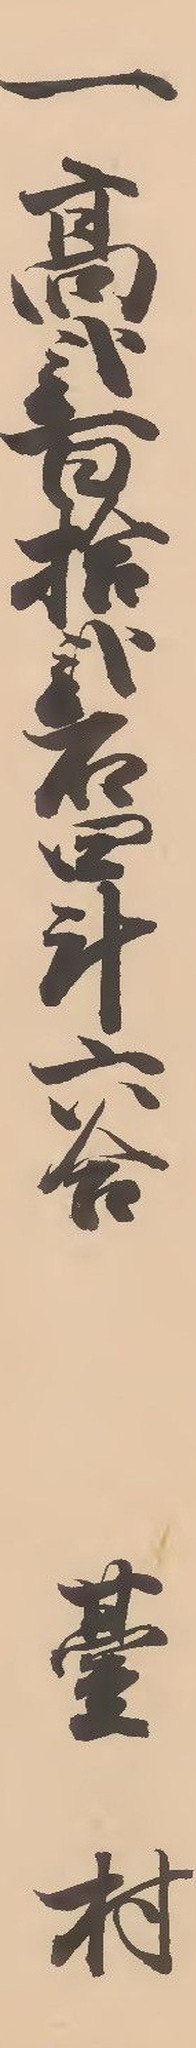一高弐百拾弐石四斗六合䑓村
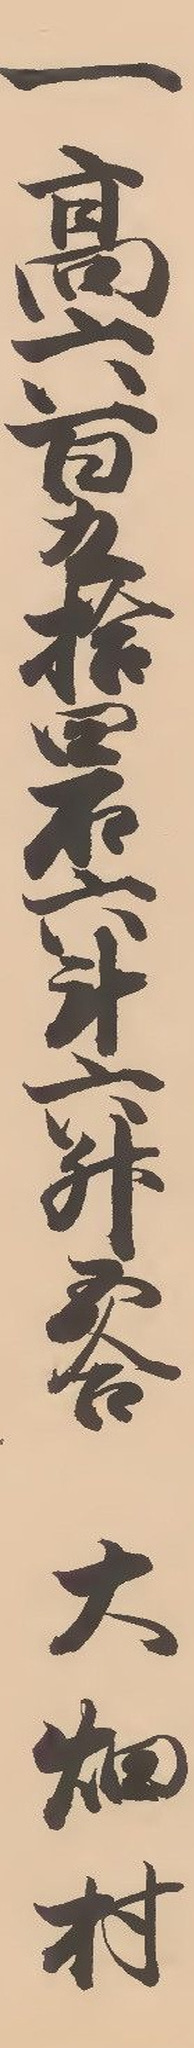一高六百九拾四石六斗六升五合大畑村
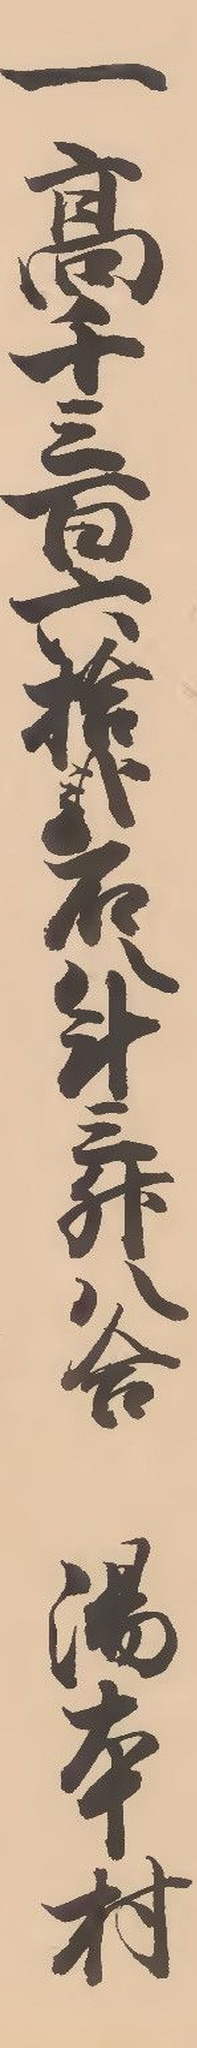一高千三百六拾弐石八斗三升八合湯本村
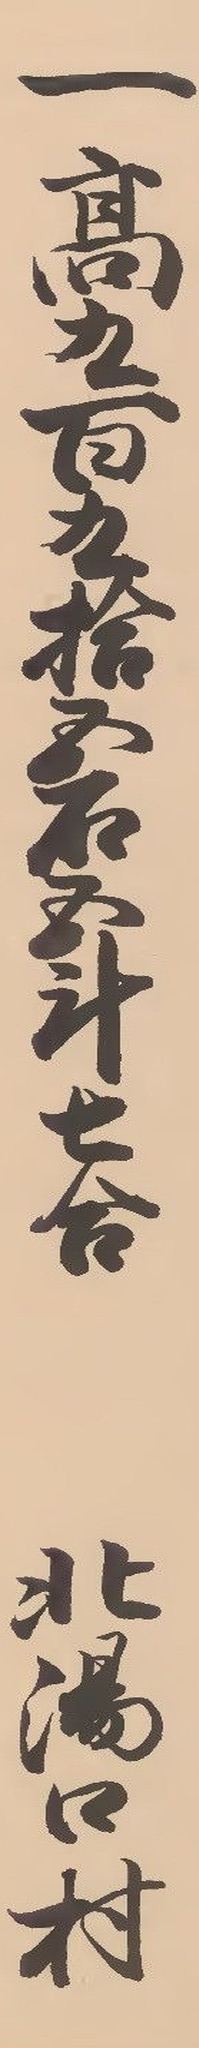一高九百九拾五石五斗七合北湯口村
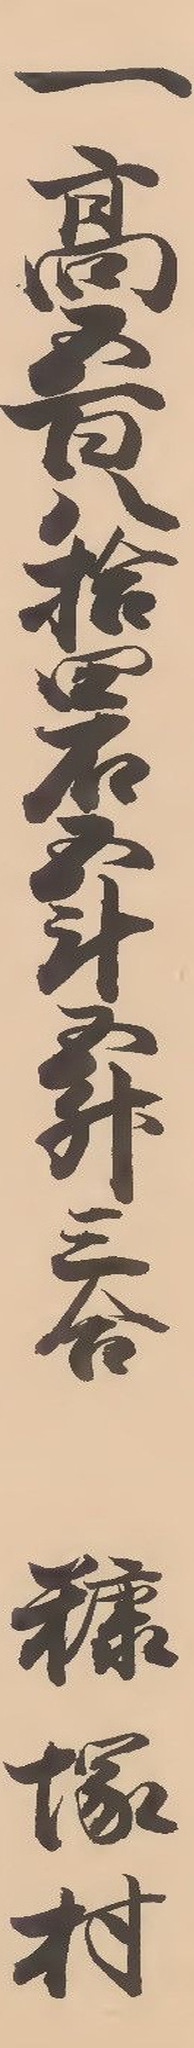一高五百八拾四石五斗五升三合糠塚村
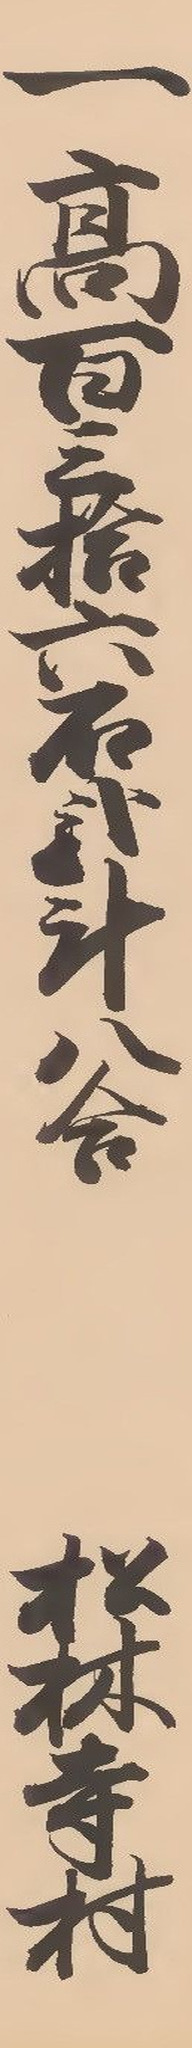一高百三拾六石弐斗八合松林寺村
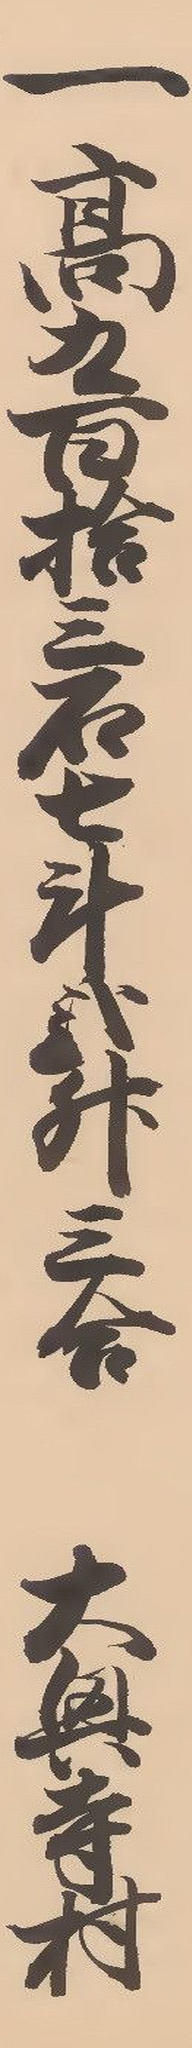一高九百拾三石七斗弐升三合大興寺村

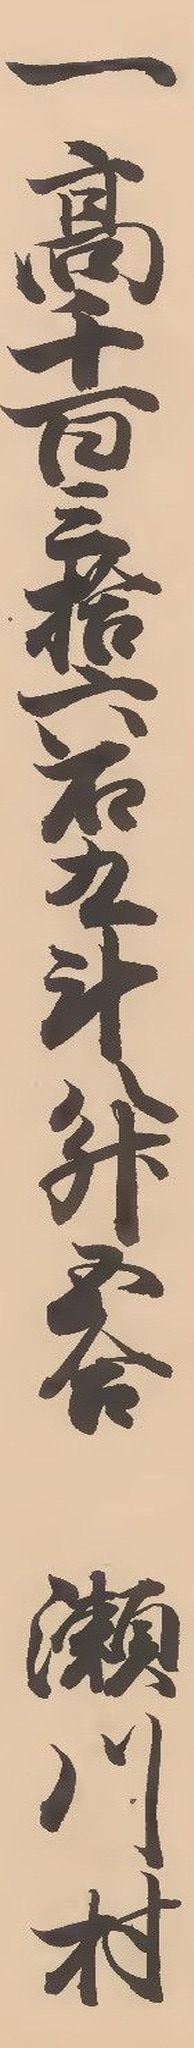一高千百三拾六石九斗八升五合瀬川村
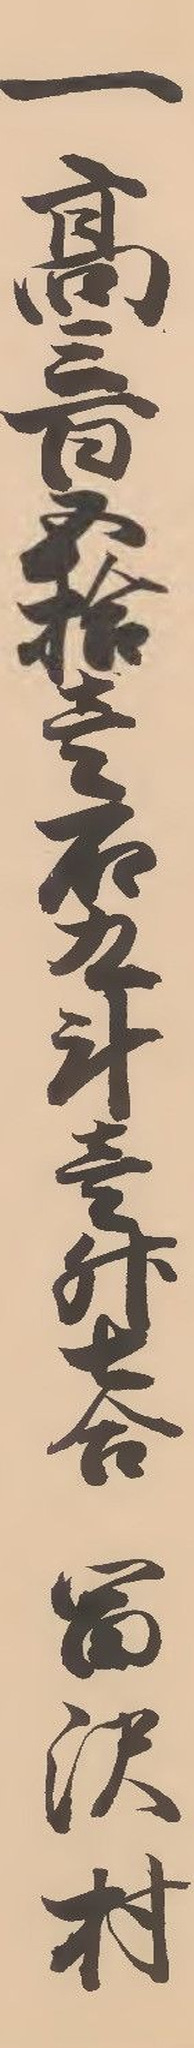一高三百五拾壱石九斗壱升七合富沢村
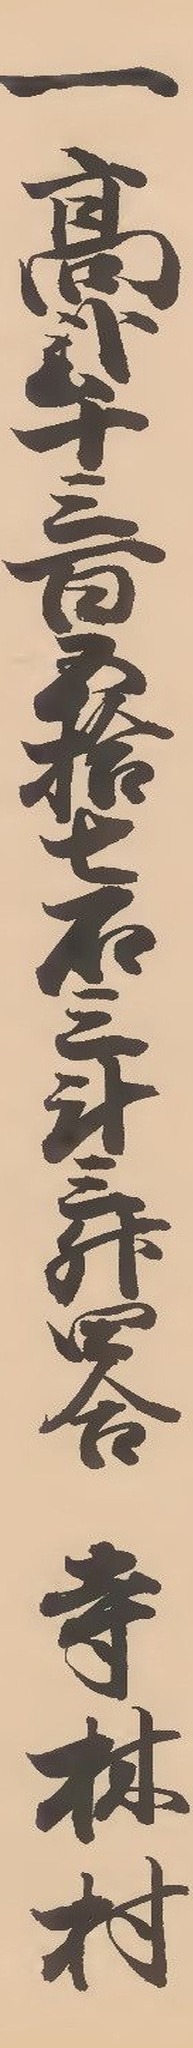一高弐千三百五拾七石三斗三升四合寺林村
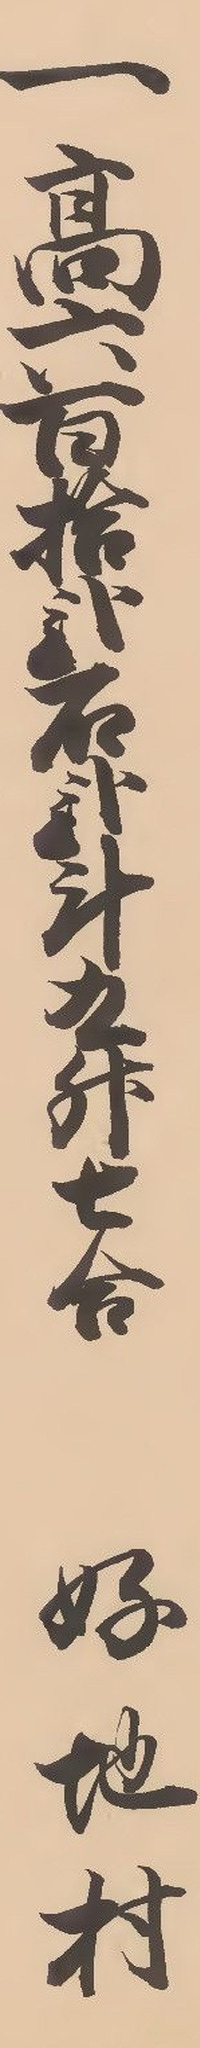一高六百拾弐石弐斗九升七合好地村
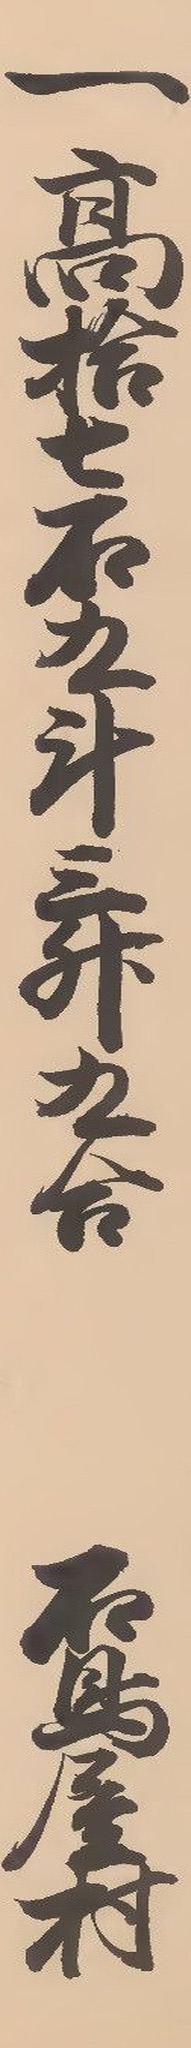一高拾七石九斗三升九合石鳥屋村
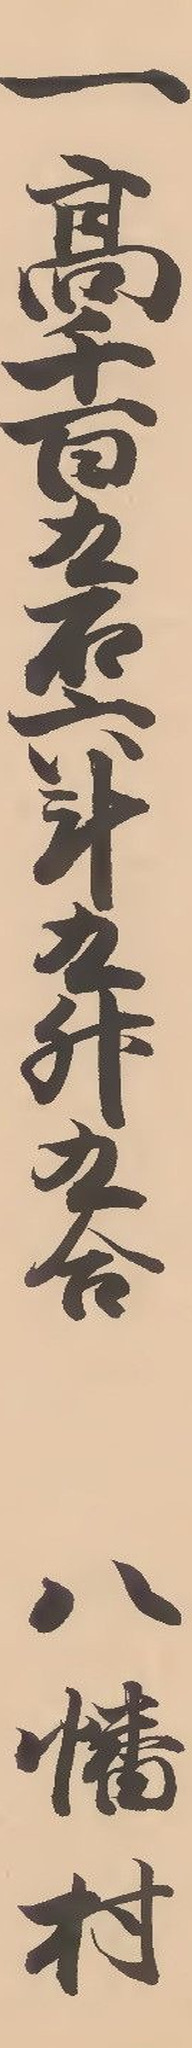一高千百九石六斗九升九合八幡村
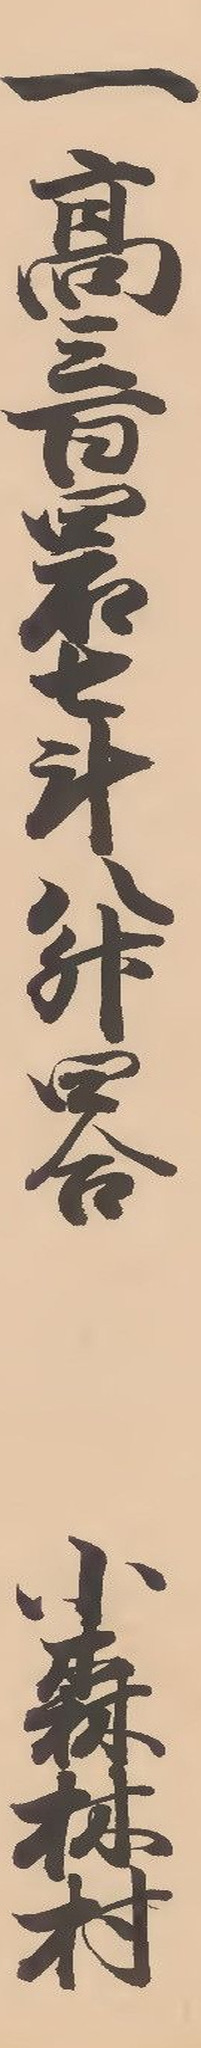一高三百四石七斗八升四合小森林村
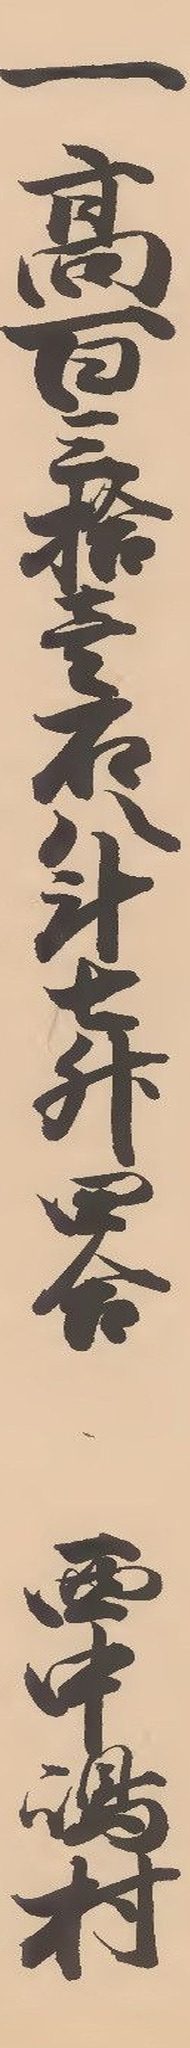一高百三拾壱石八斗七升四合西中島村

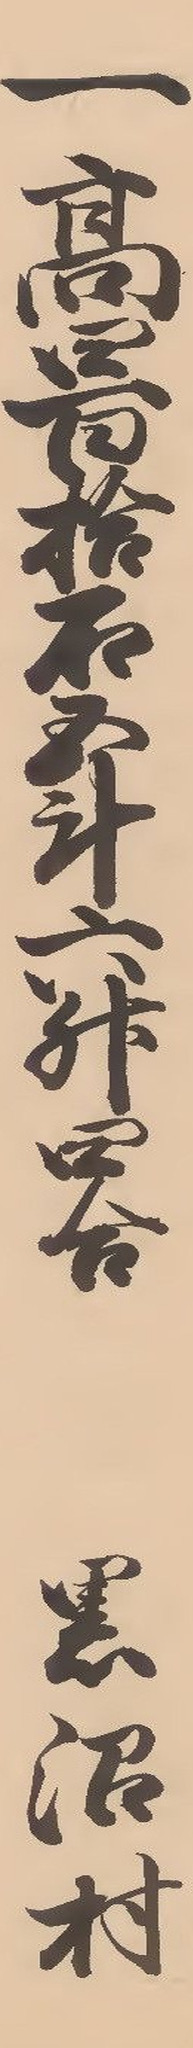一高四百拾石五斗六升四合黒沼村
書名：陸奥国郷帳　６
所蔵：国立公文書館 National Archives of Japan
